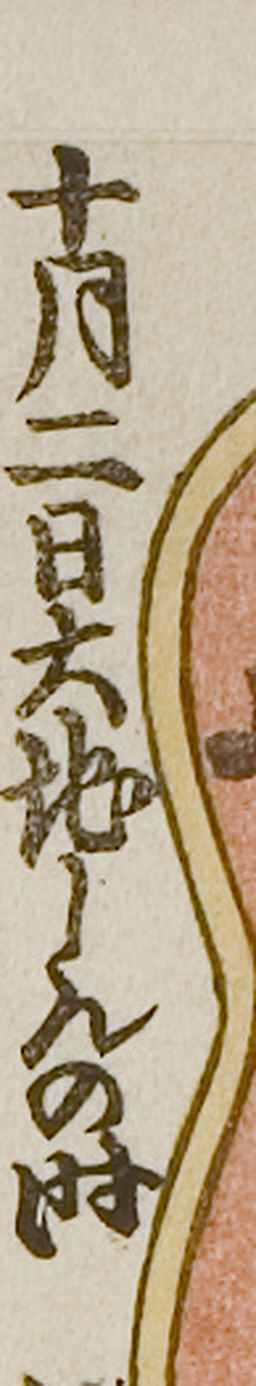十月二日大地しんの時
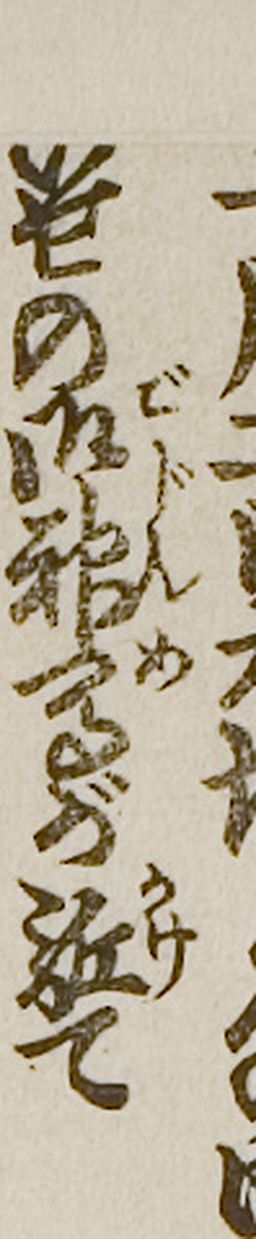いせの御神馬が駈て
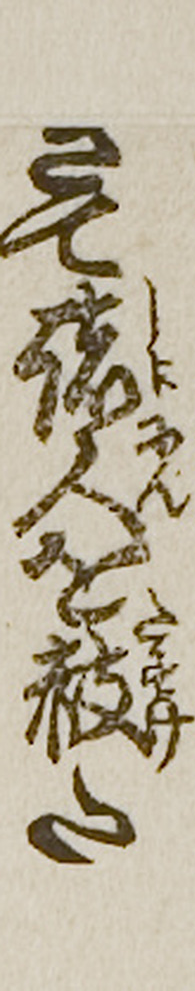きて諸人を赦た
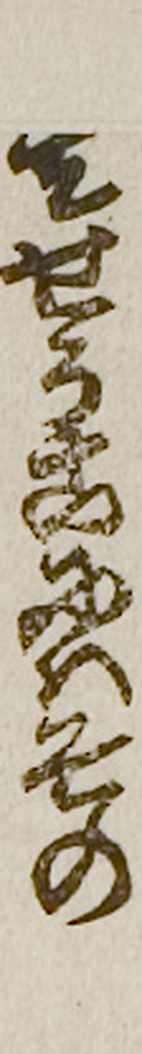其せうこにはその
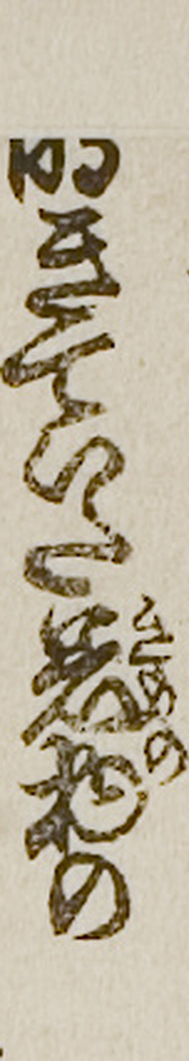時きていた着物の
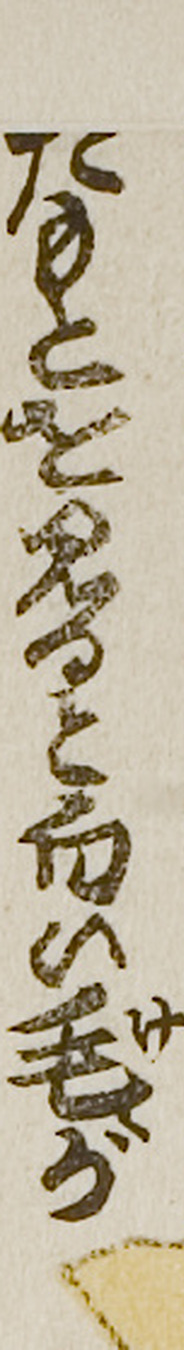たもとを見ると白い毛が
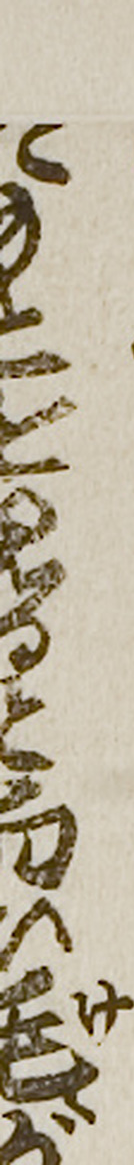たもとを見ると白い毛が
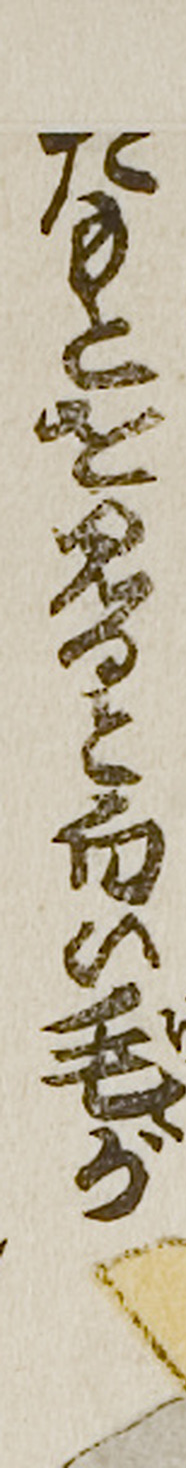たもとを見ると白い毛が
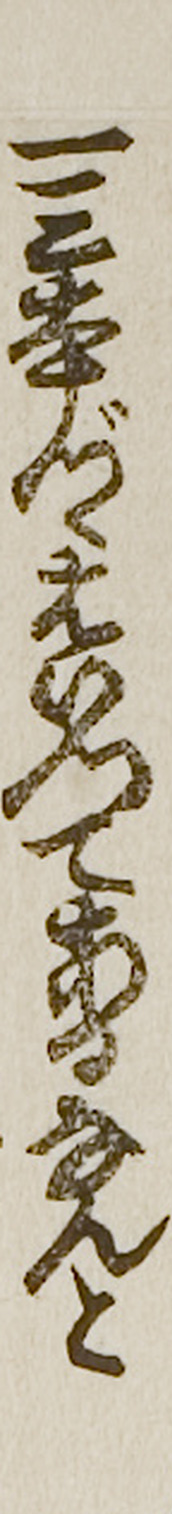二三本づつはいつてあるなんと
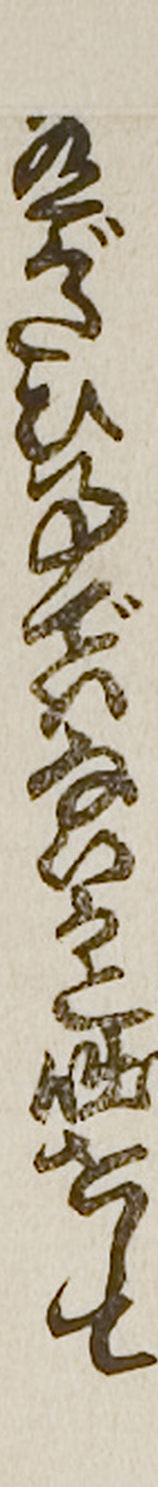有がたひ事ではないかと咄をして
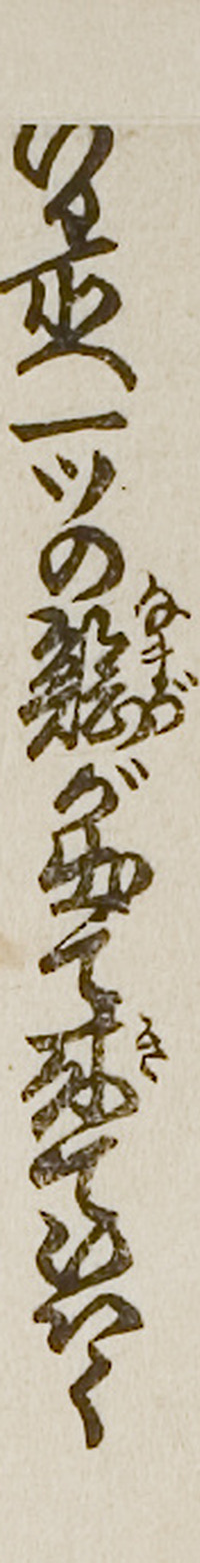いる所へ一つの鯰がでて来ていはく
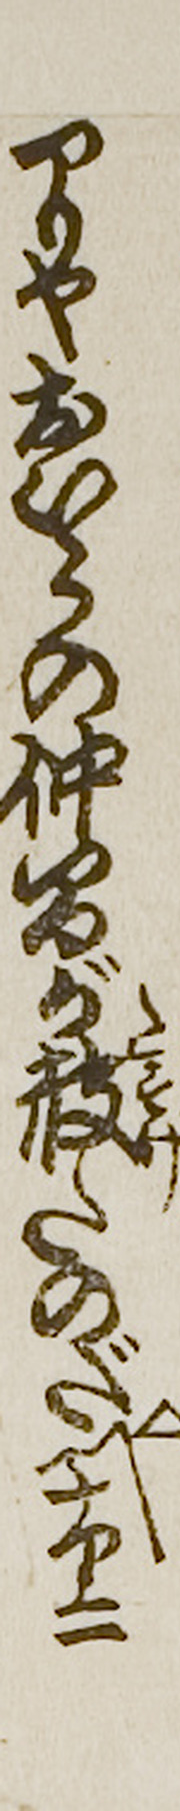ありやおいらの仲間が赦たのだ△〽︎なあに
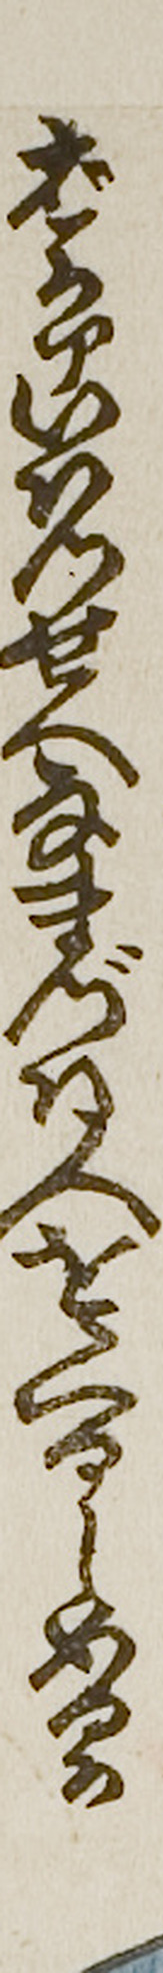ばかあいはつせへなまづは人をくるしめるか
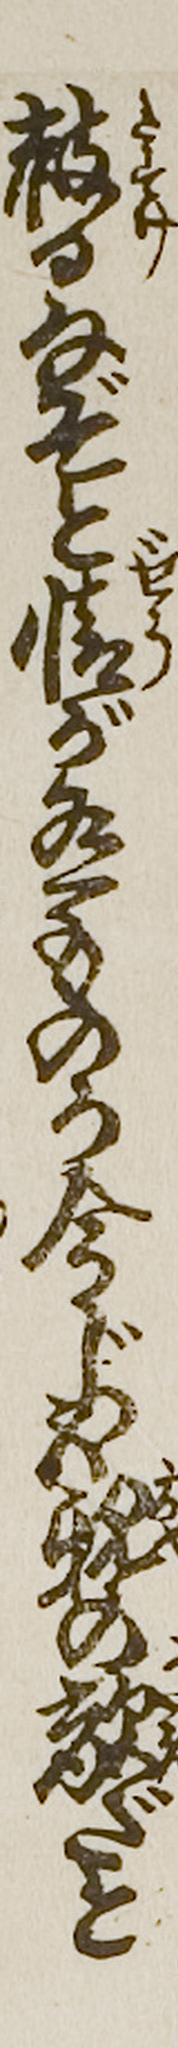赦るなぞと情が有ものか今じや親の敵だと
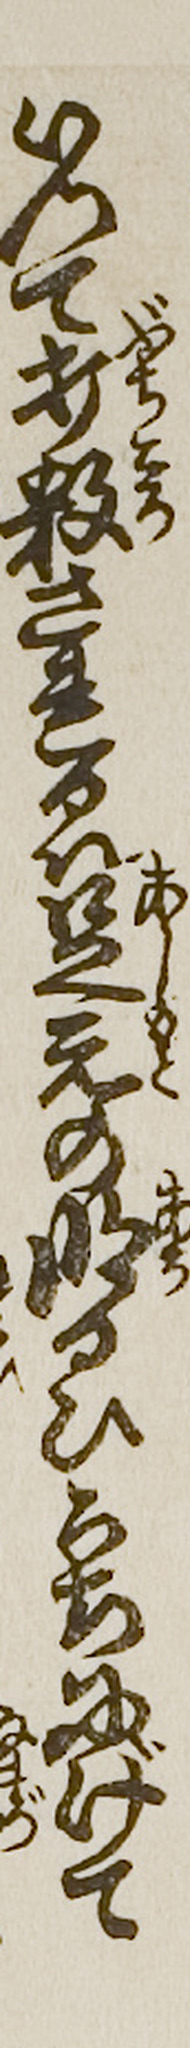いつて打殺されるは足元の明るひうちにげて
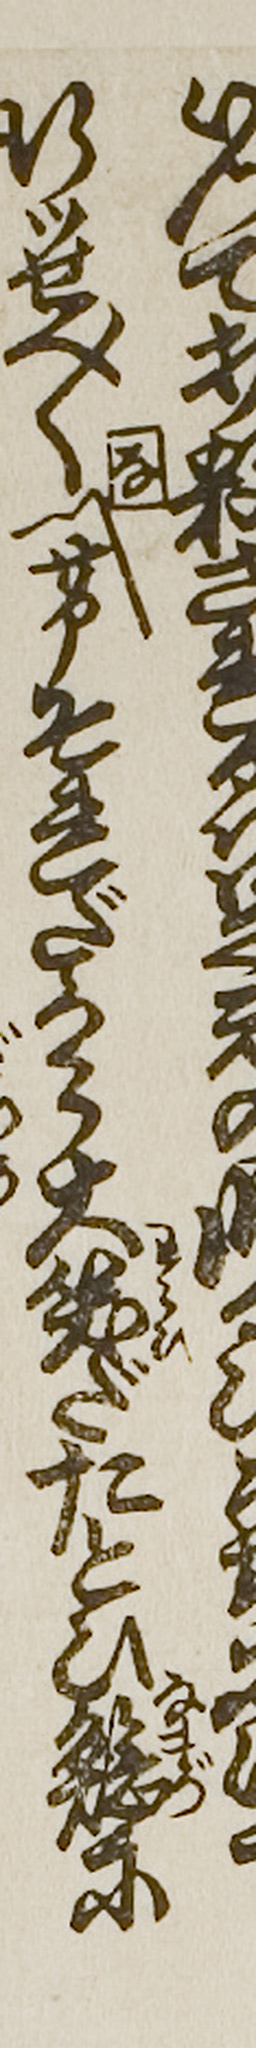行つせへ〳〵な〽︎さあそれだから大笑だたとひ鯰に
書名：世直し鯰の情
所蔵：東京大学総合図書館 General Library in the University of Tokyo, JAPAN
